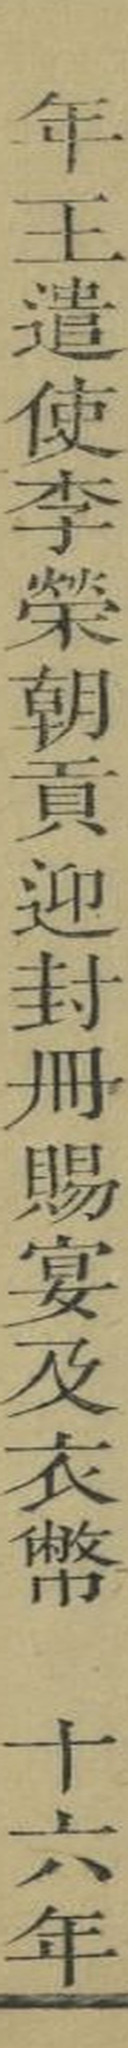年王遣使李栄朝貢迎封冊賜宴及衣幣十六年
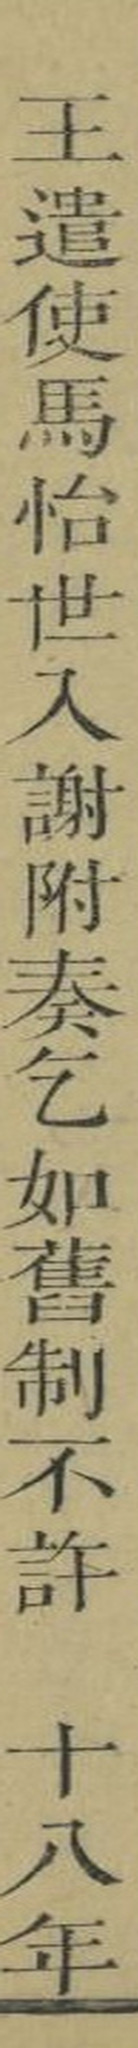王遣使馬怡世入謝附奏乞如旧制不許十八年
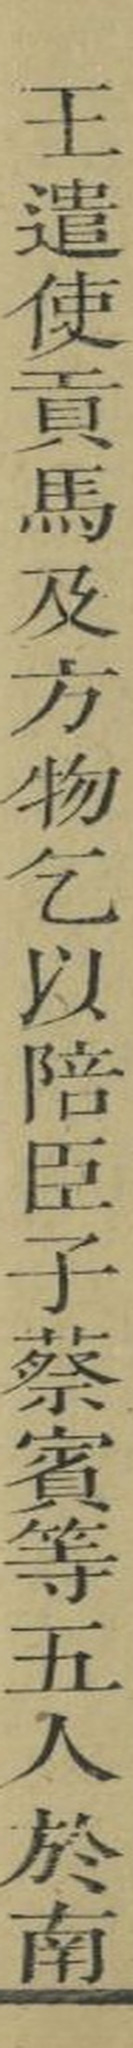王遣使貢馬及方物乞以陪臣子蔡賓等五入於南
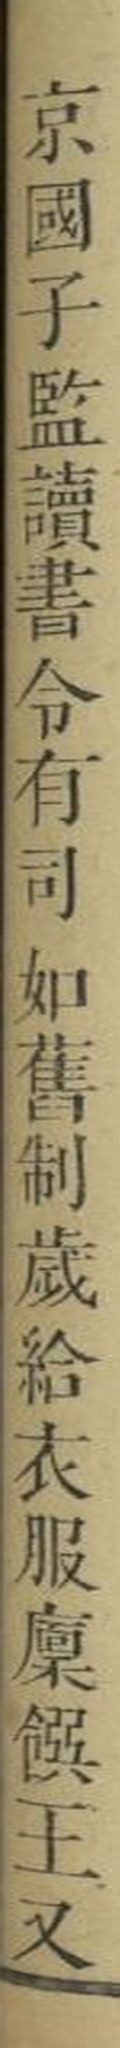京国子監読書令有司如旧制歳給衣服廩饌王又
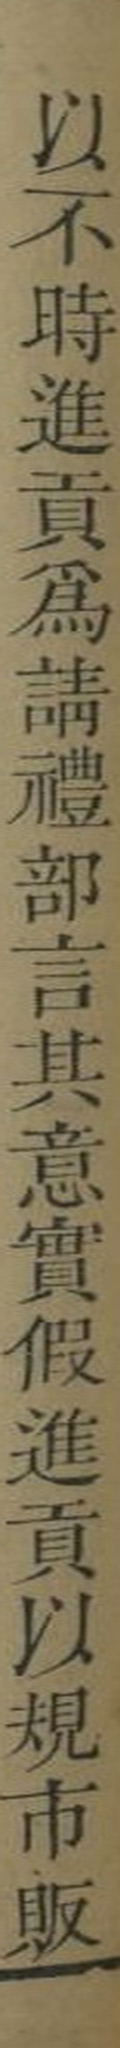以不時進貢為請礼部言其意実仮進貢以規市販
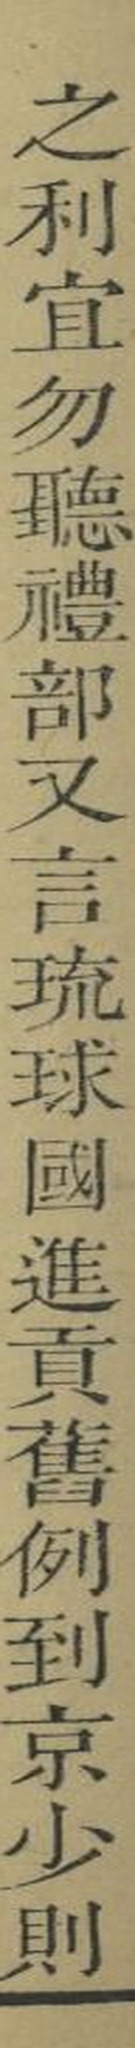之利宜勿聴礼部又言琉球国進貢旧例到京少則
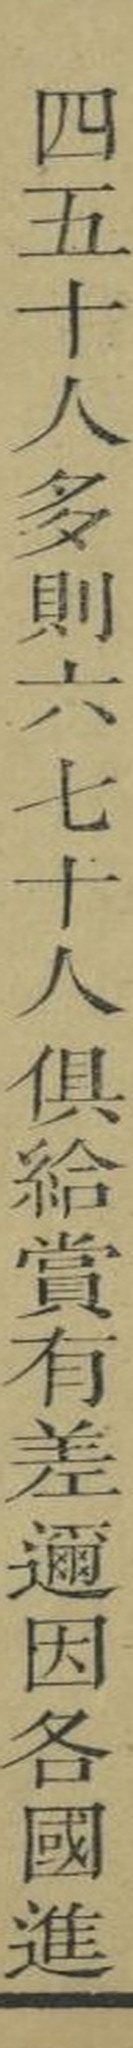四五十人多則六七十人俱給賞有差邇因各国進
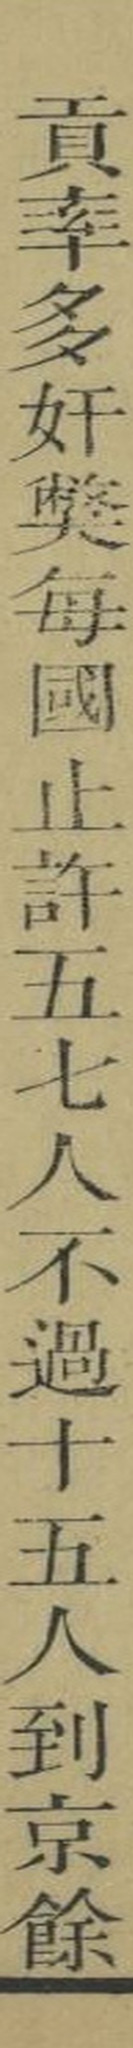貢率多奸獘毎国止許五七人不過十五人到京余
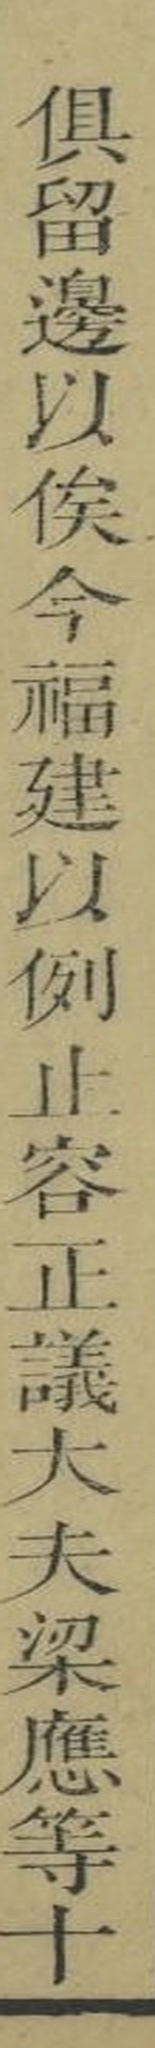俱留辺以俟今福建以例止容正議大夫梁応等十
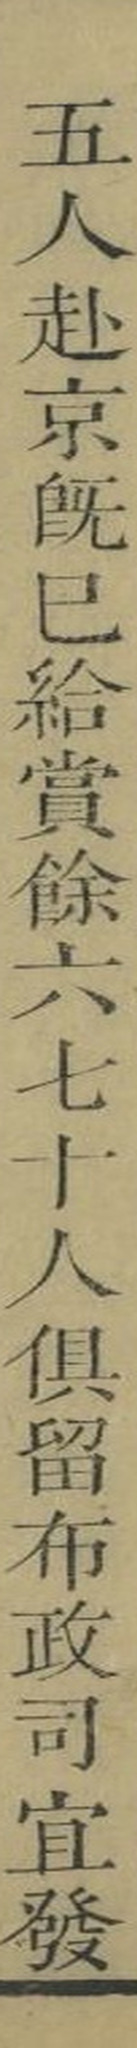五人赴京既巳給賞余六七十人俱留布政司宜発
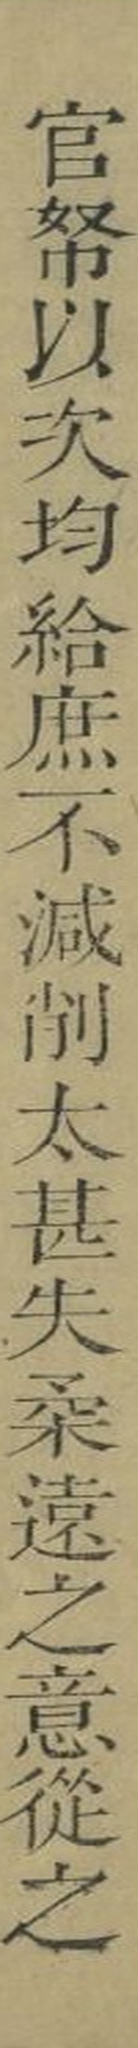官帑以次均給庶不減削太甚失柔遠之意従之
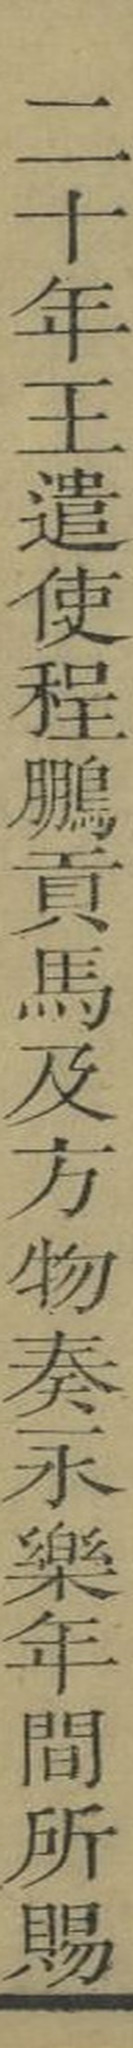二十年王遣使程鵬貢馬及方物奏永楽年間所賜
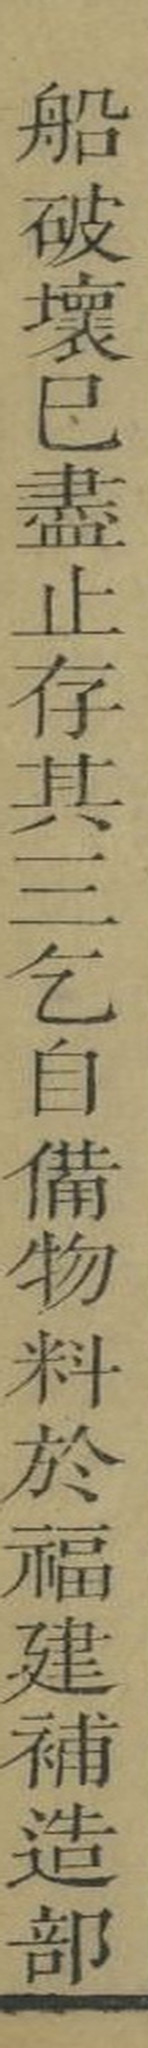船破壊巳尽止存其三乞自備物料於福建補造部

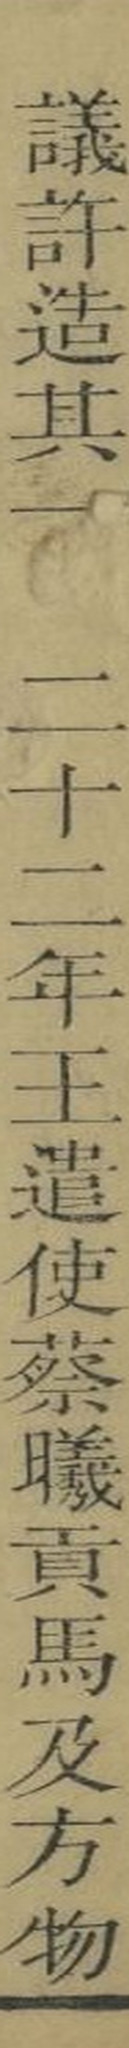義許造其一二十二年王遣使蔡䂀貢馬及方物
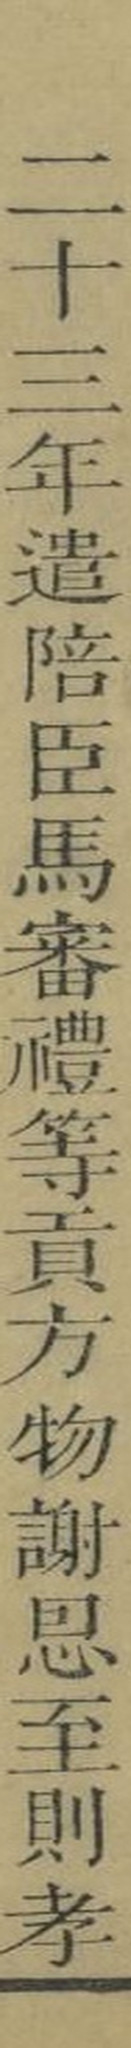二十三年遣陪臣馬審礼等貢方物謝恩至則孝
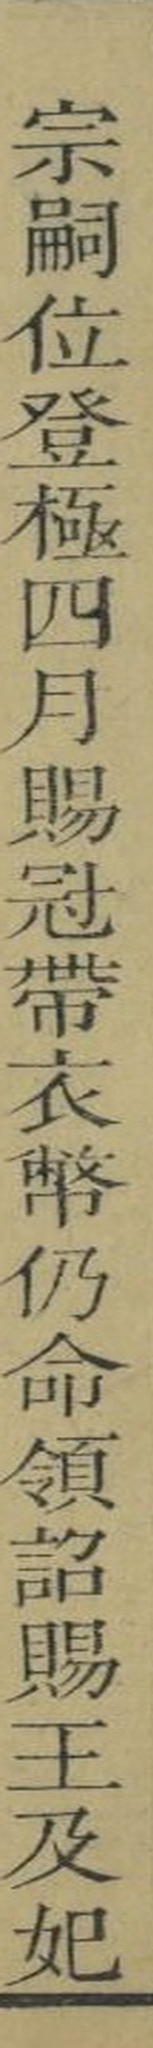宗嗣位登極四月賜冠帯衣幣仍命領詔賜王及妃
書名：中山伝信録 巻三
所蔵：University of the Ryukyus Library
